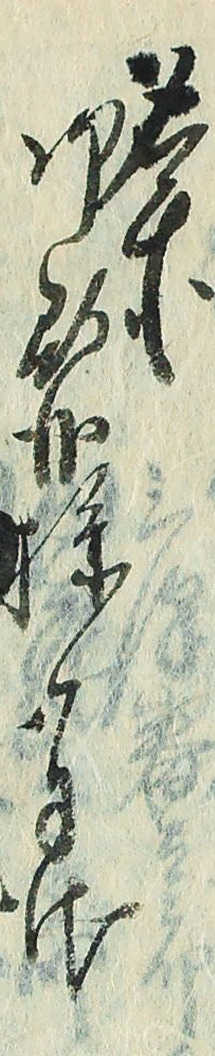御郡代様御手代
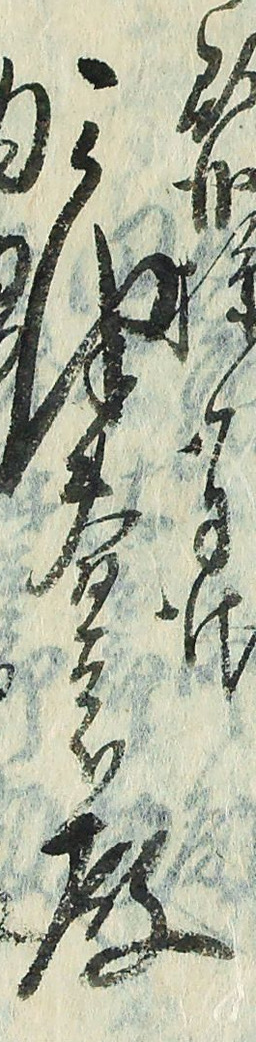三沢春太郎殿
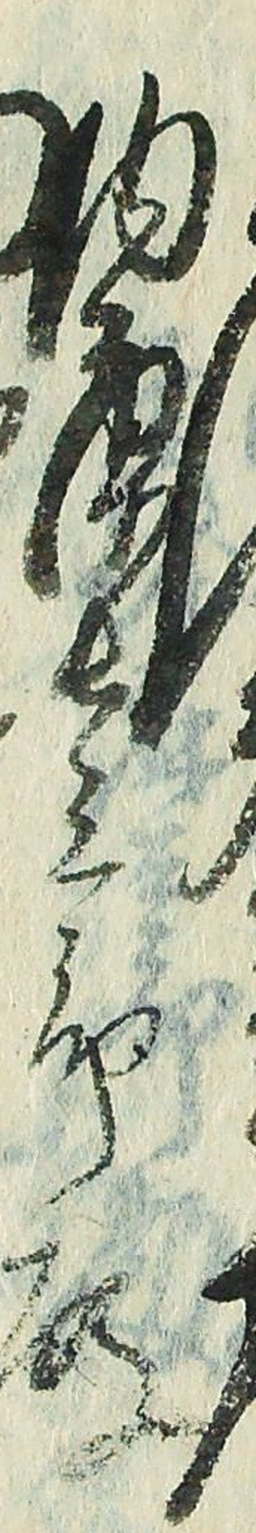内藤長三郎殿
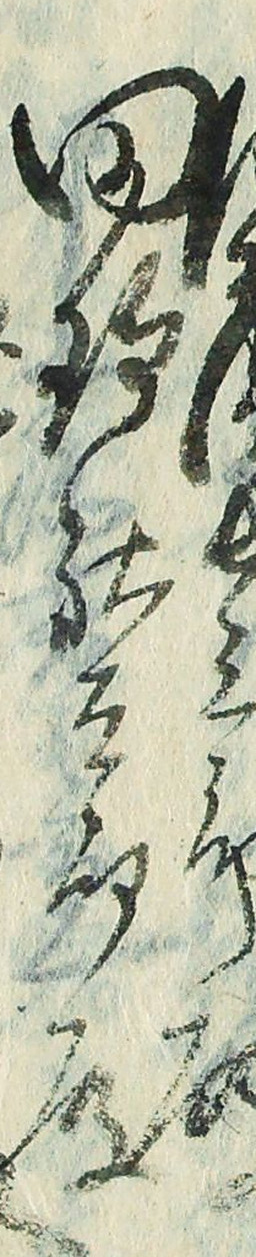田野祐太郎殿
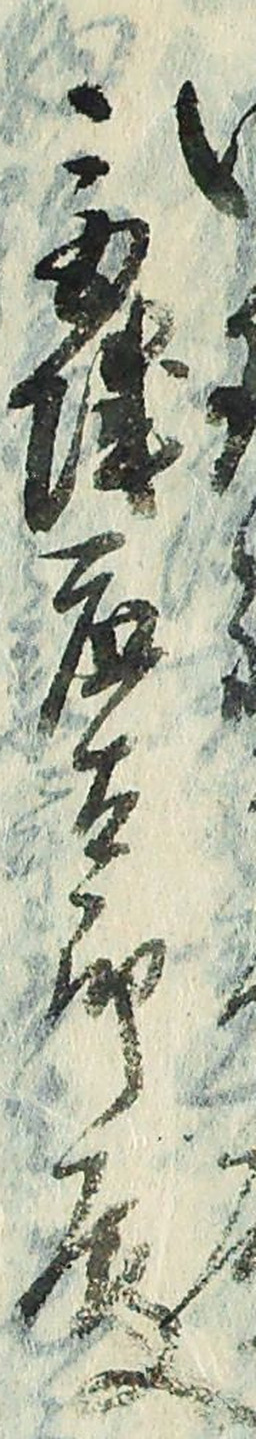宮城麻太郎

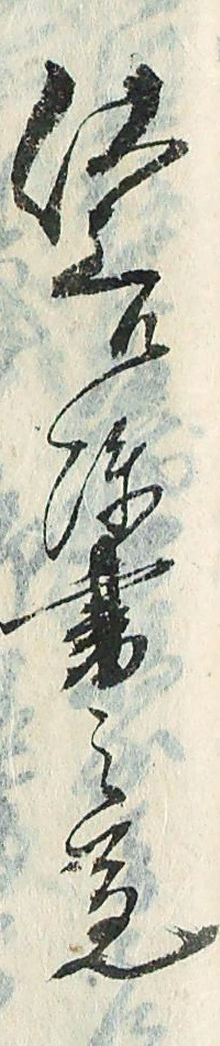仕上候添書之覚
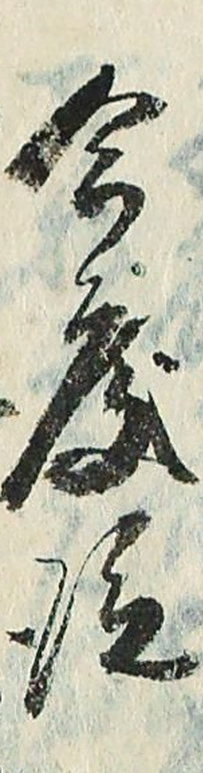今度従
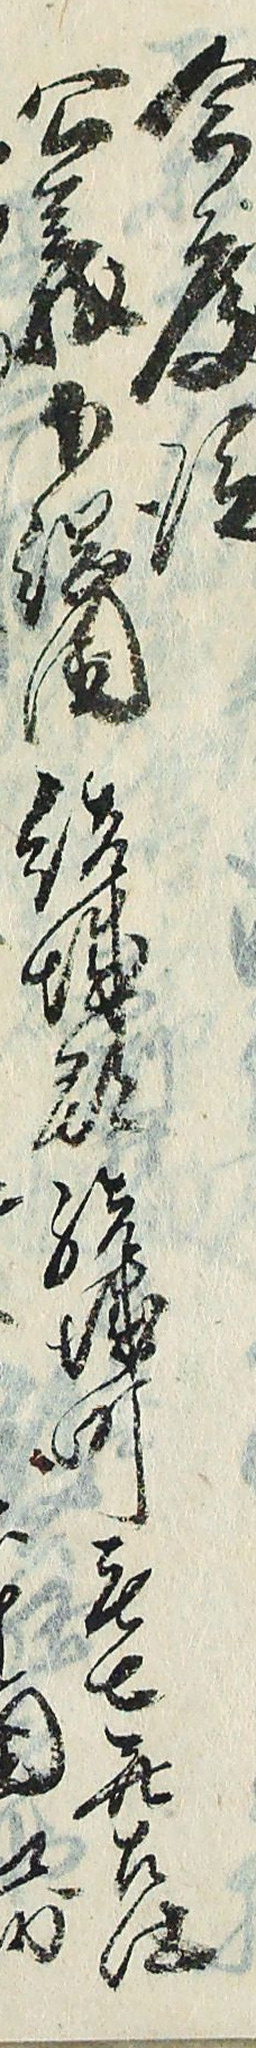公義下総国結城郡結城町庄七幷召仕
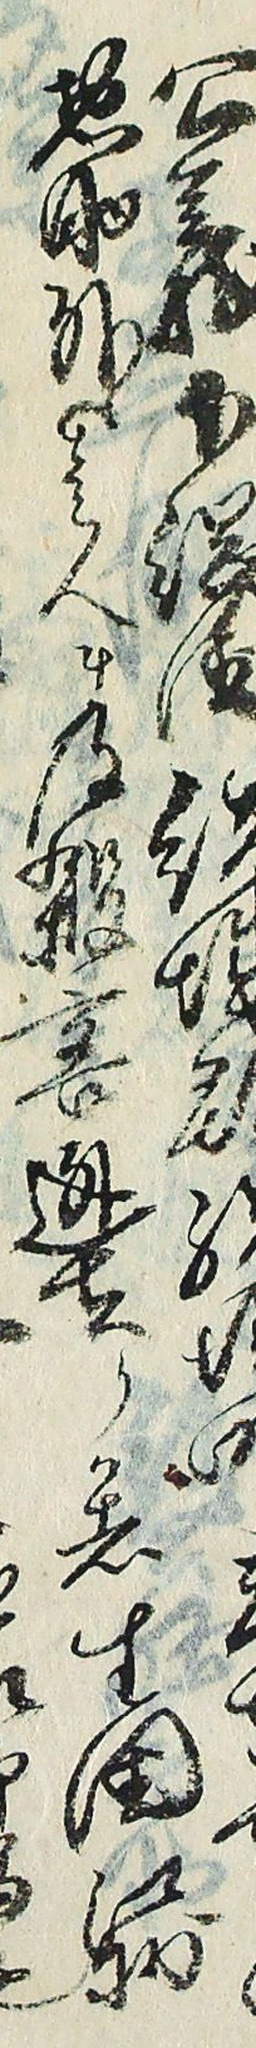惣助外壱人を及殺害逃去り候者生国江州
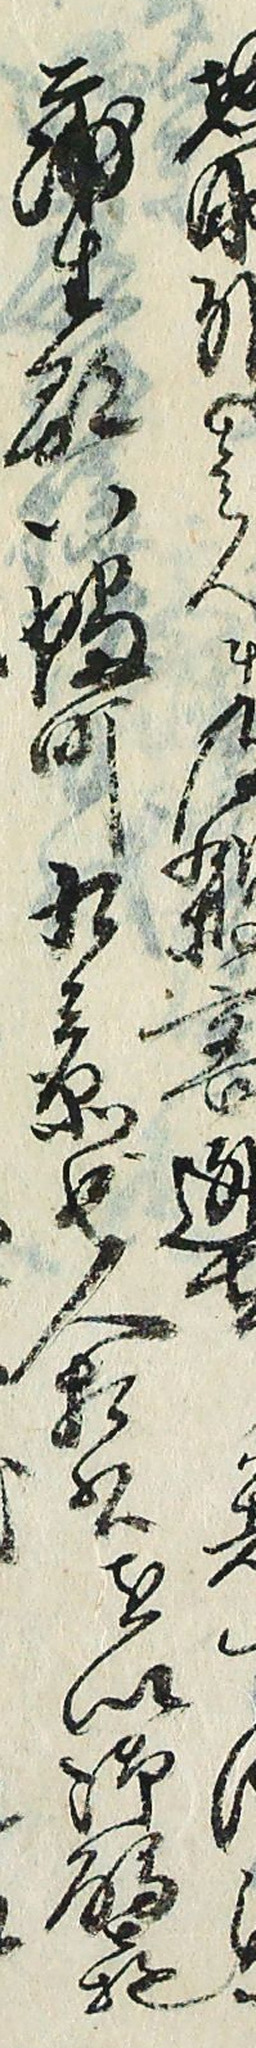蒲生郡八幡町九兵衛義人相書を以御触被遊
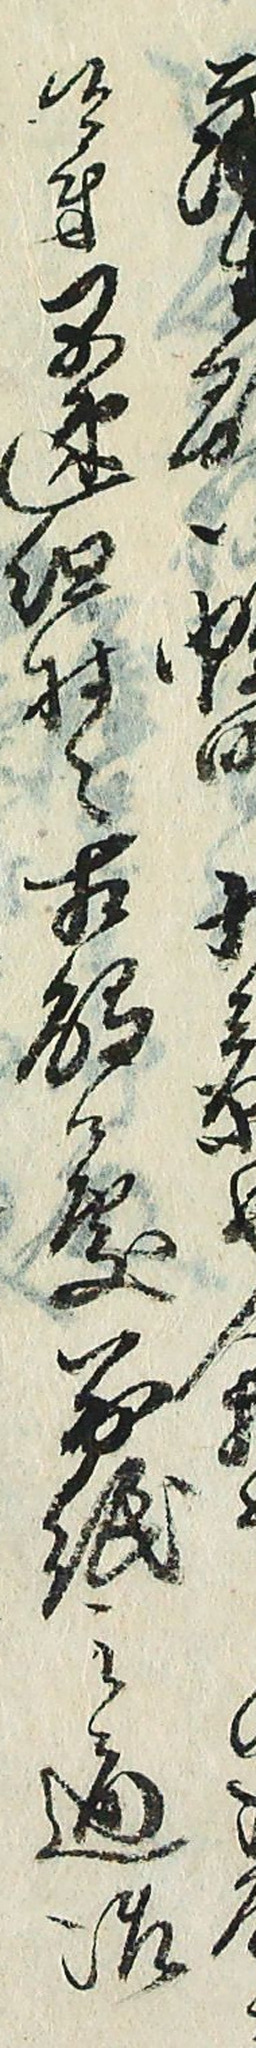候に付早速組村々相触候処別紙之通御
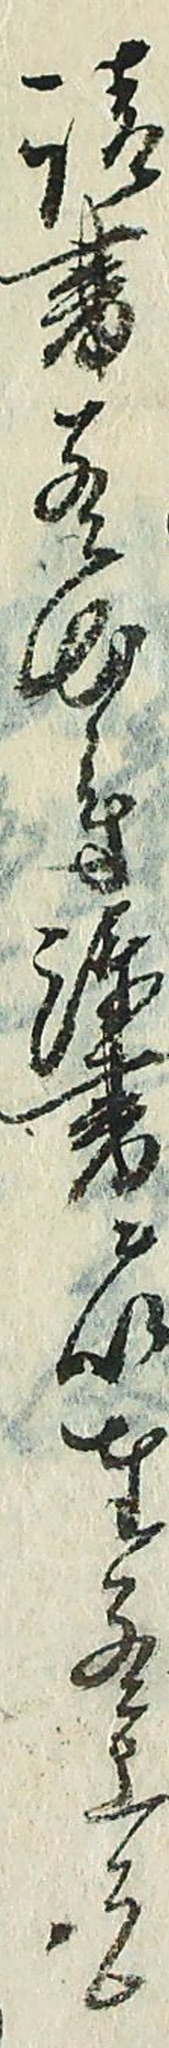請書差出候に付添書を以奉差上候以上
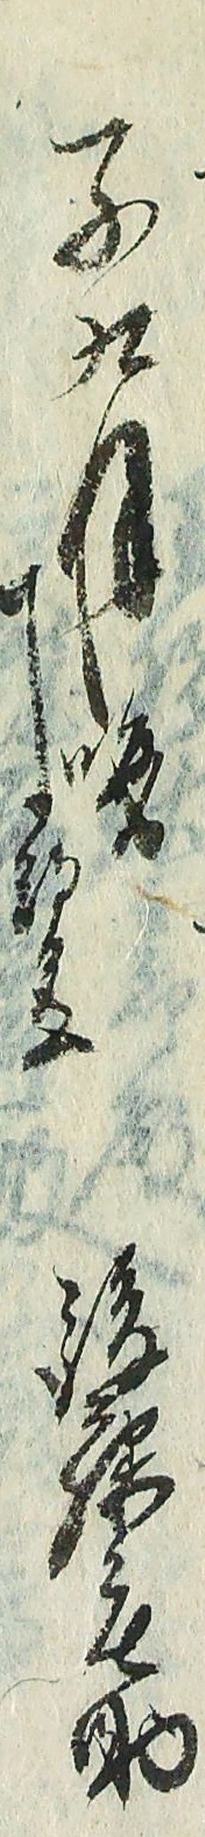子九月晦日後藤庄助
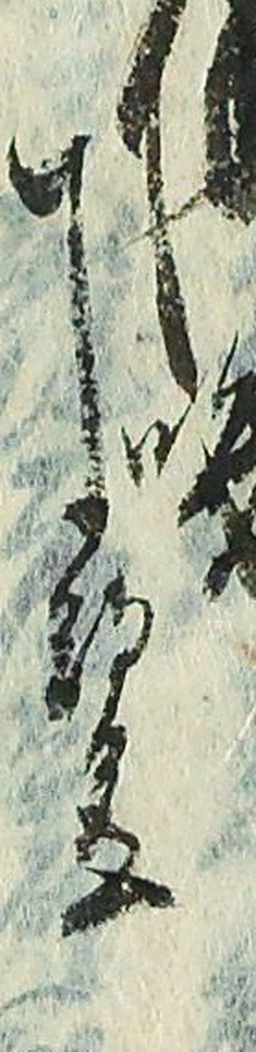十月朔日
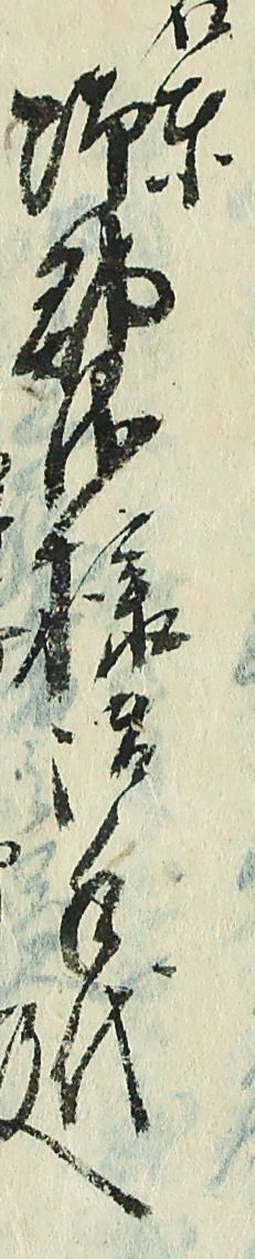御郡代様御手代
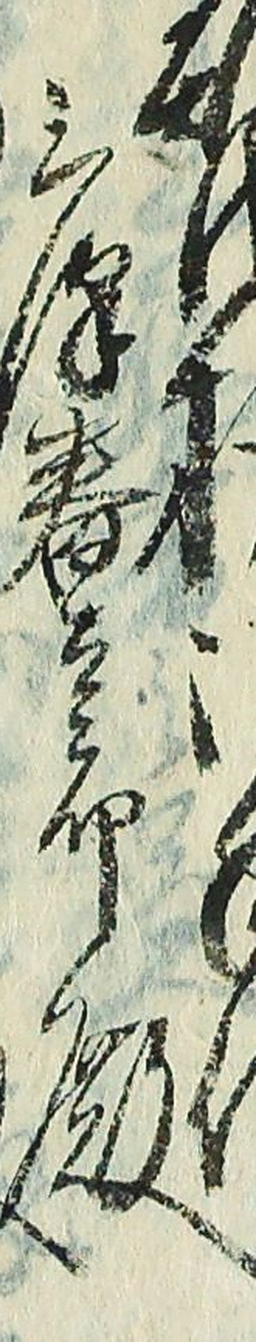三沢春太郎殿
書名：諸御用御□受書控
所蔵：鳴門教育大学 Naruto University of Education
